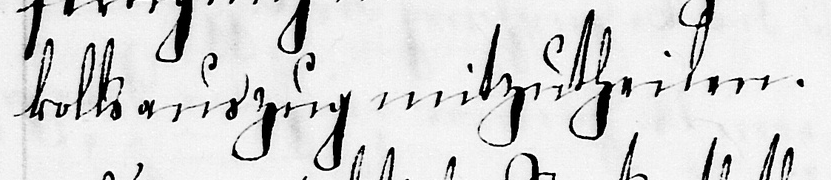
kollsauszug mitzutheilen.
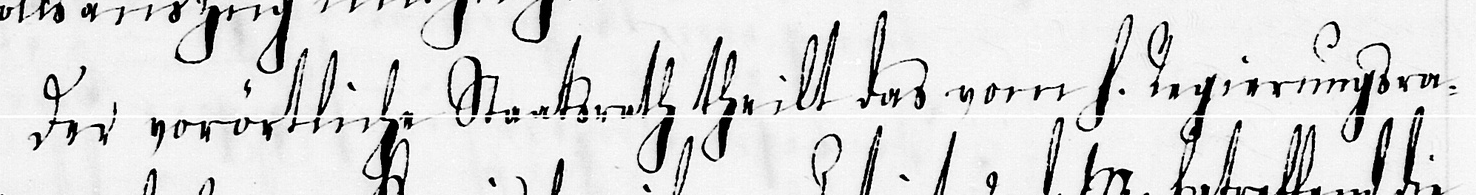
Der vorörtliche Staatsrath theilt das vom h. Regierungsra¬
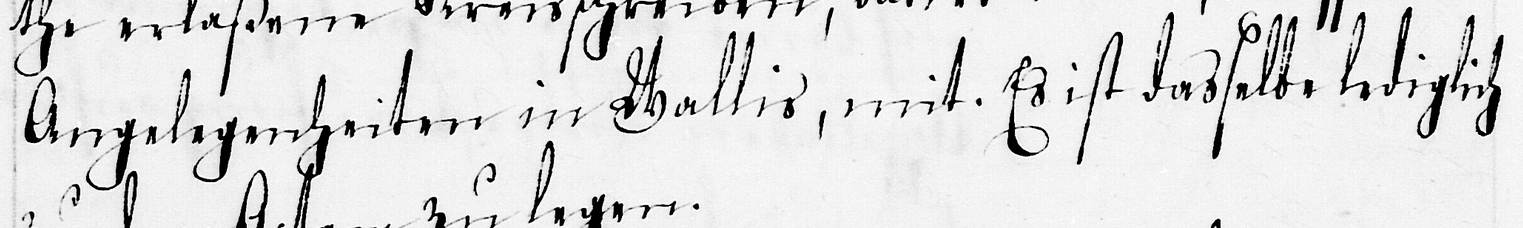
Angelegenheiten in Wallis, mit. Es ist dasselbe lediglich
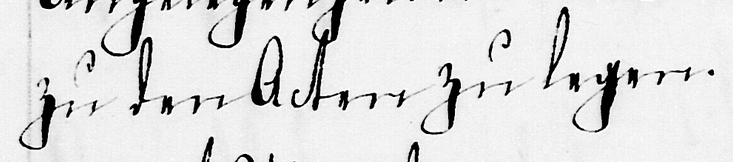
zu den Acten zu legen.
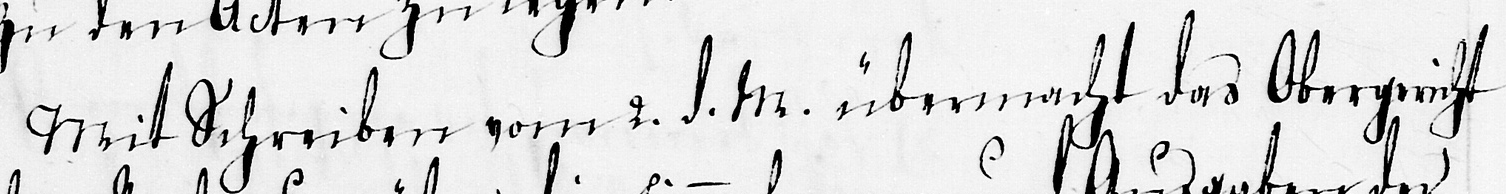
Mit Schreiben vom 2. d. M. übermacht das Obergericht
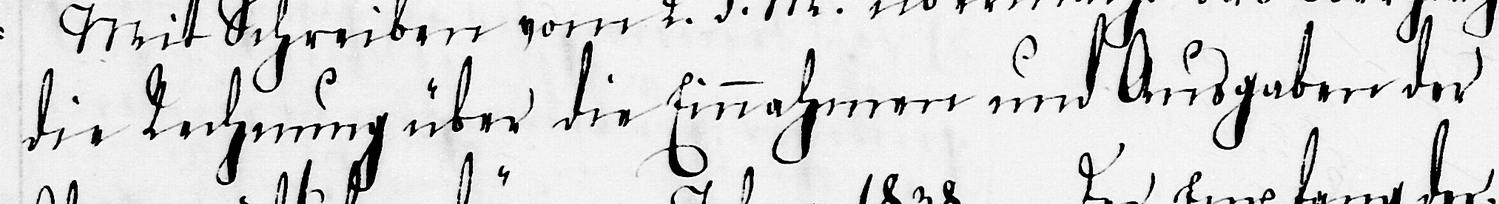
die Rechnung über die Einnahmen und Ausgaben der
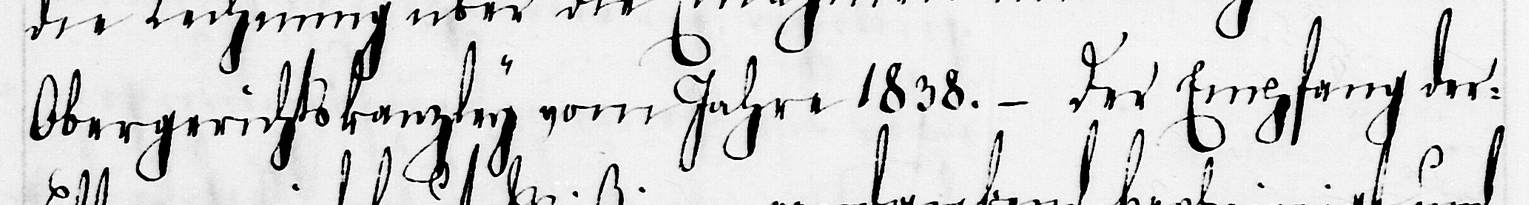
Obergerichtskanzley vom Jahre 1838. – Der Empfang der¬
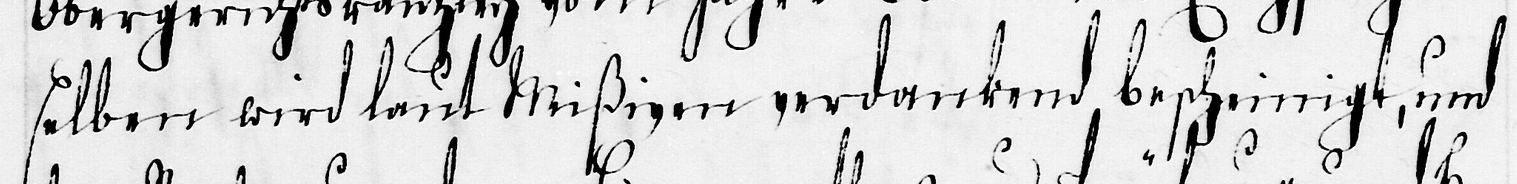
selben wird laut Mißiven verdankend bescheinigt, und
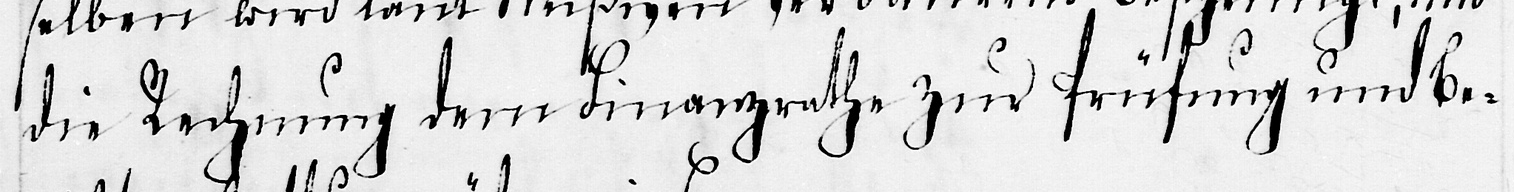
die Rechnung dem Finanzrathe zur Prüfung und Be¬
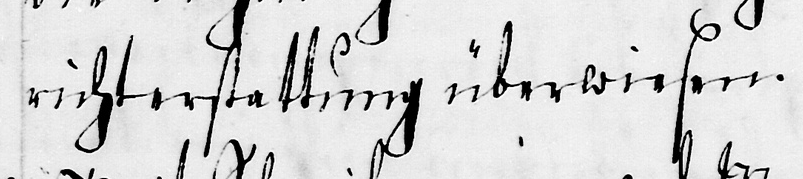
richterstattung überwiesen.
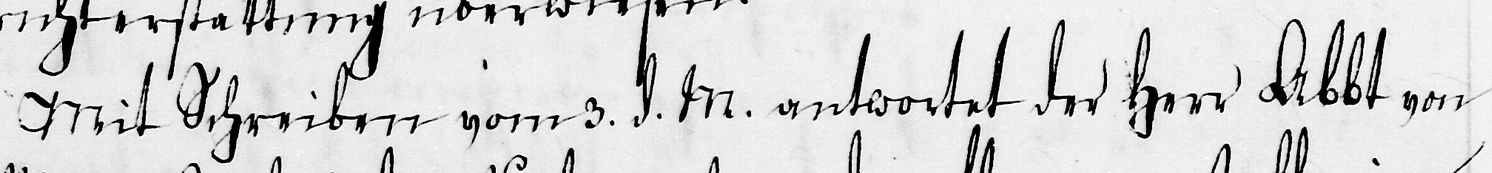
Mit Schreiben vom 3. d. M. antwortet der Herr Abbt von
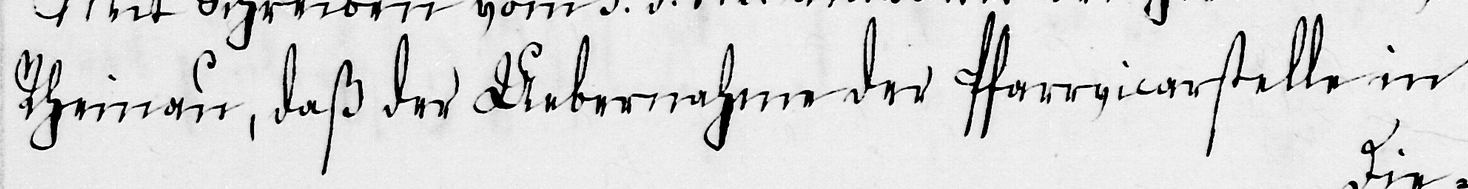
Rheinau, daß der Uebernahme der Pfarrvicarstelle in
